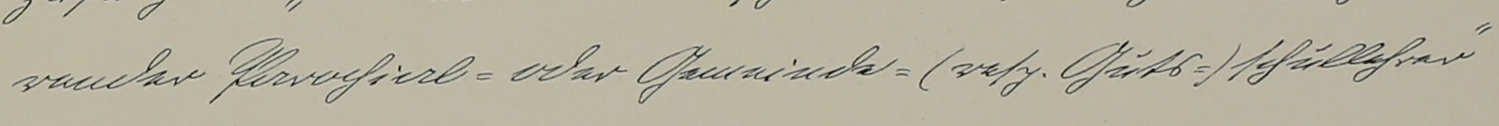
render Parochial- oder Gemeinde- (resp. Guts-)schullehrer“
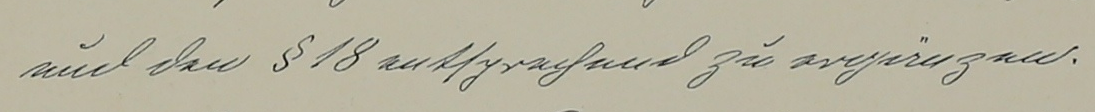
und den § 18 entsprechend zu ergänzen.
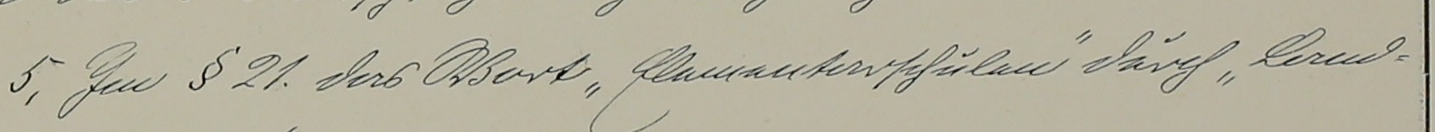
5. Im § 21. das Wort „Elementarschulen“ durch „Land-
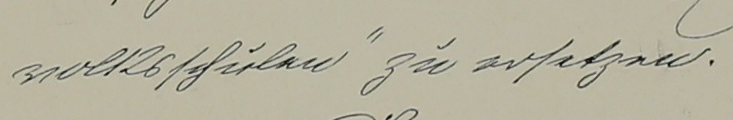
volksschulen“ zu ersetzen.
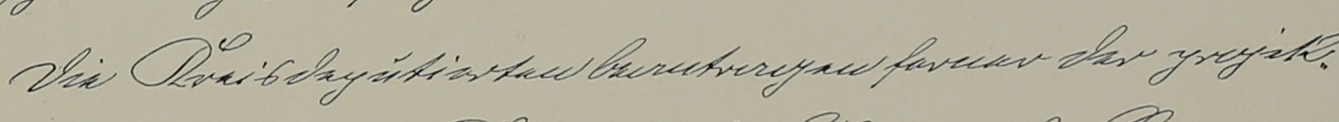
Die Kreisdeputierten beantragen ferner, der projek-
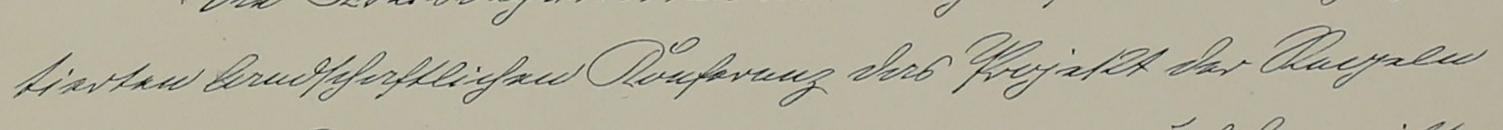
tierten landschaftlichen Konferenz das Projekt der Regeln
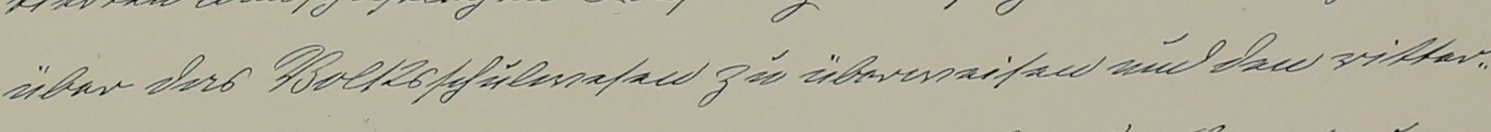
über das Volksschulwesen zu überweisen und den ritter-
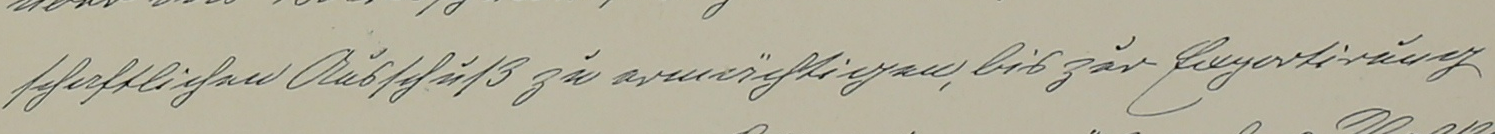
schaftlichen Ausschuß zu ermächtigen, bis zur Exportirung
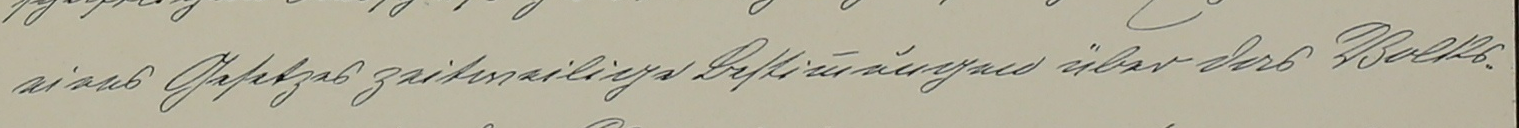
eines Gesetzes zeitweilige Bestimmungen über das Volks-
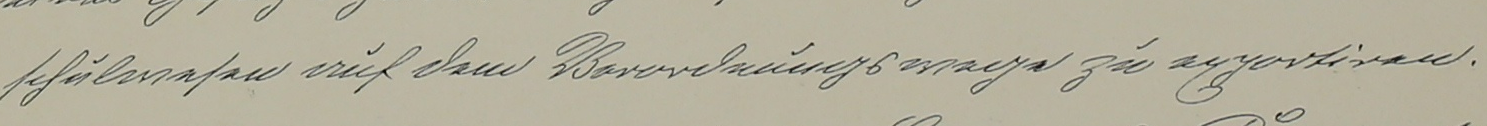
schulwesen auf dem Verordnungswege zu exportiren.
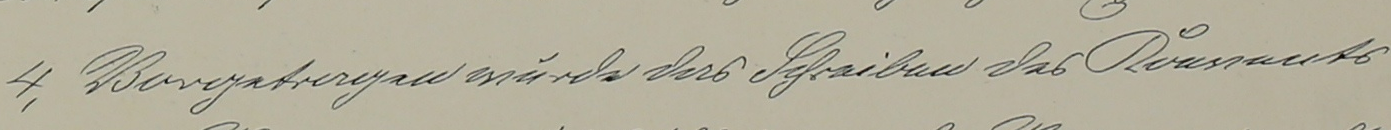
4. Vorgetragen wurde das Schreiben des Konvents
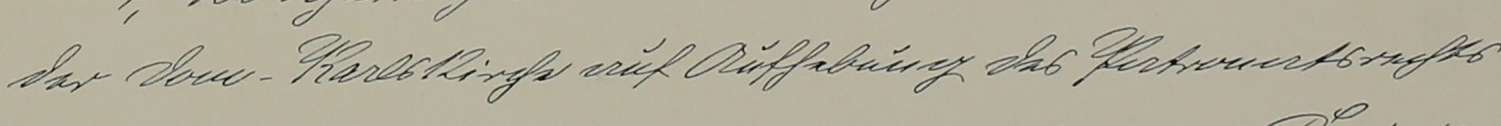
der Dom-Karlskirche auf Aufhebung des Patronatsrechts
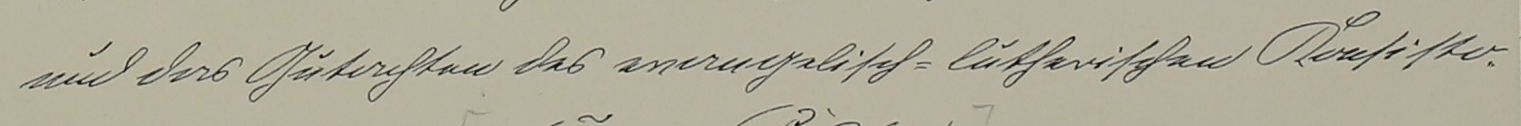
und das Gutachten des evangelisch-lutherischen Konsisto-
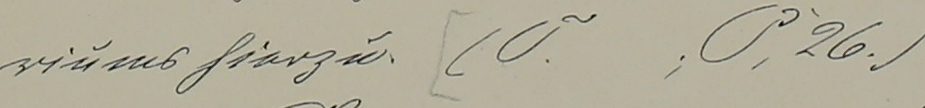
riums hierzu. (T. ; P.26.)
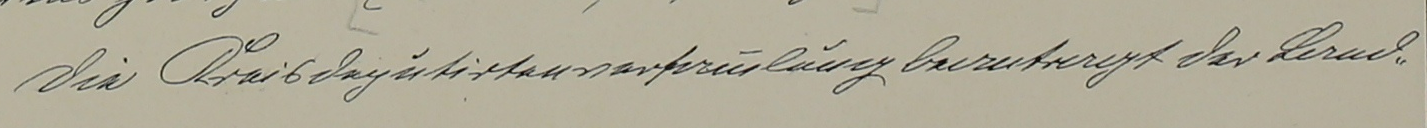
Die Kreisdeputirtenversammlung beantragt der Land-
